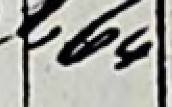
1,64
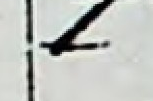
I
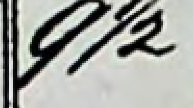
9 ½
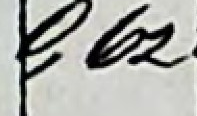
0,62
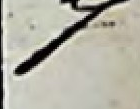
7
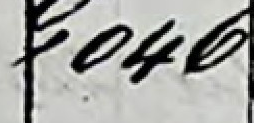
0,046
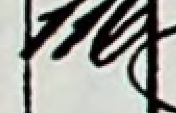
116
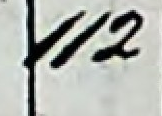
112
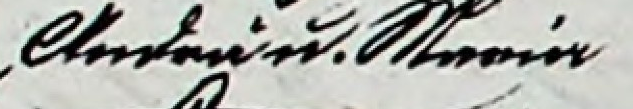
Andrä u. Maria
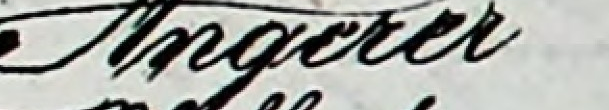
Angerer
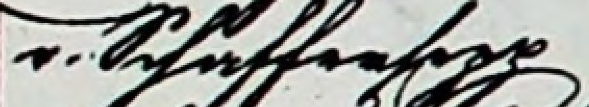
v. Schafferlepp
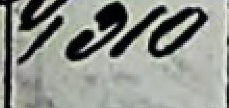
0,310
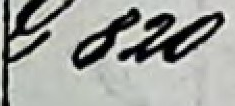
0,820
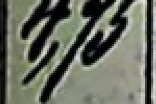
4,75
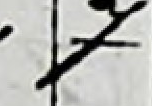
7
